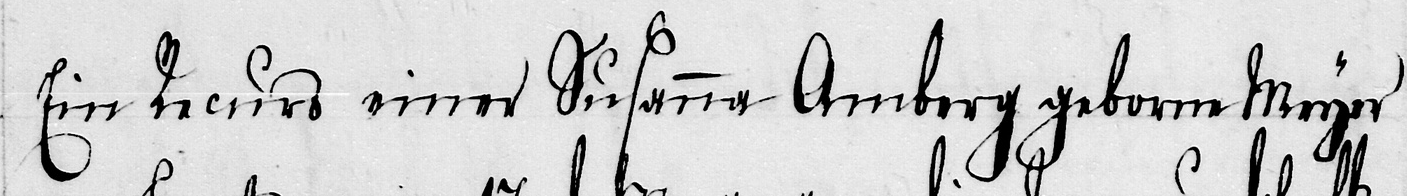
Ein Recurs einer Susanna Amberg geborne Meyer
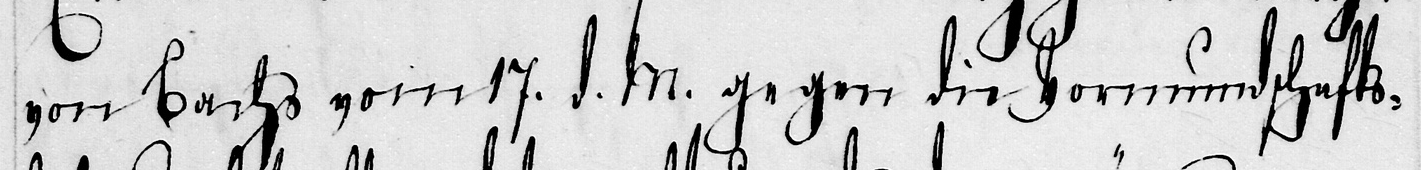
von Bachs vom 17. d. M. gegen die Vormundschafts¬
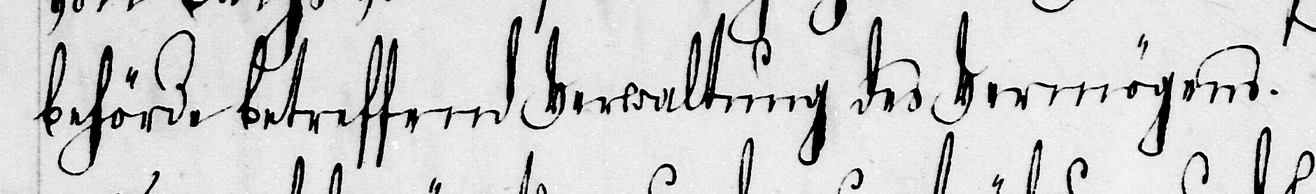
behörde betreffend Verwaltung des Vermögens.
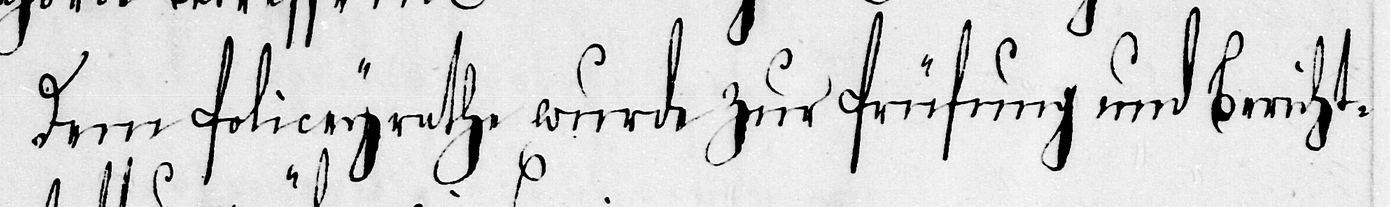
Dem Policeyrathe wurde zur Prüfung und Berich¬
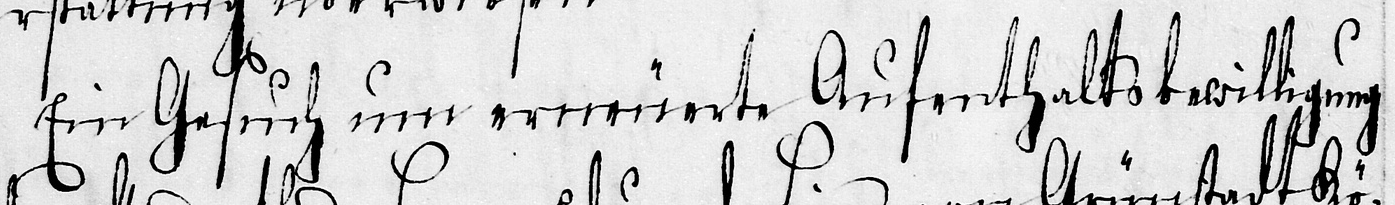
Ein Gesuch um erneuerte Aufenthaltsbewilligung
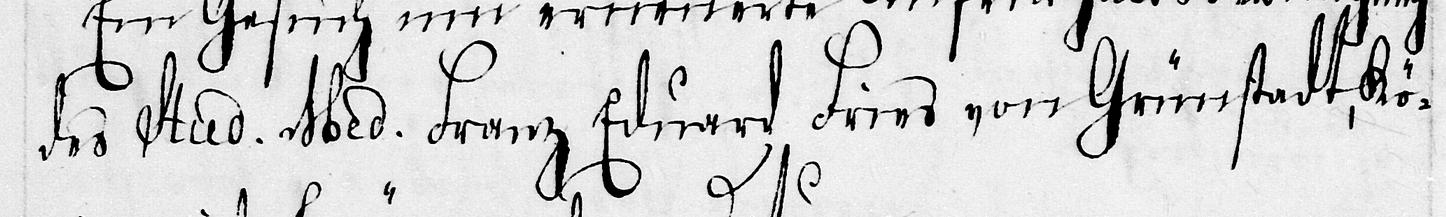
des Stud. Med. Franz Eduard Fries von Grünstadt, Kö¬
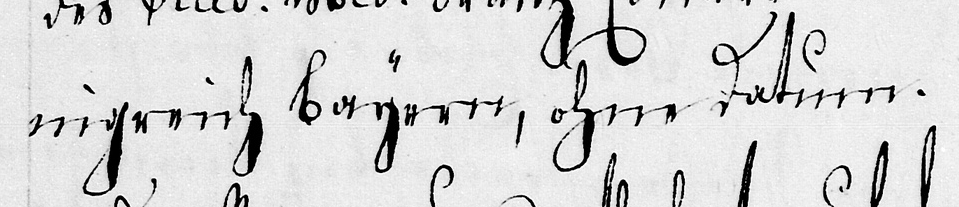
nigreich Bayern, ohne Datum.
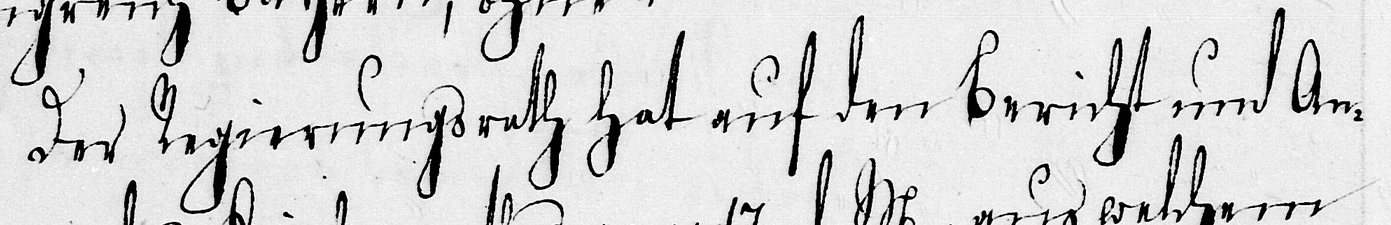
Der Regierungsrath hat auf den Bericht und An¬
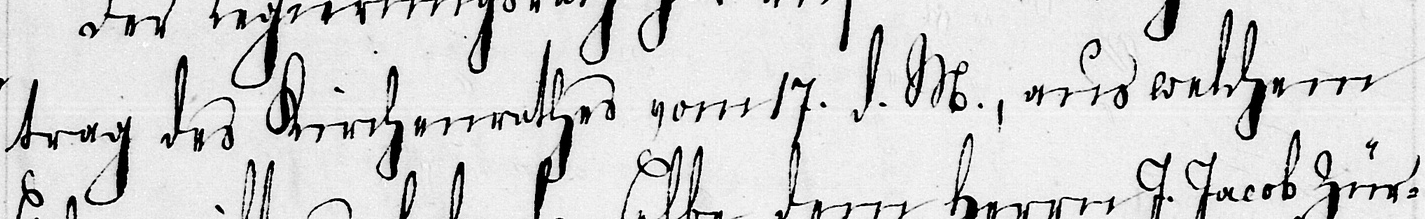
trag des Kirchenrathes vom 17. d. M., aus welchem
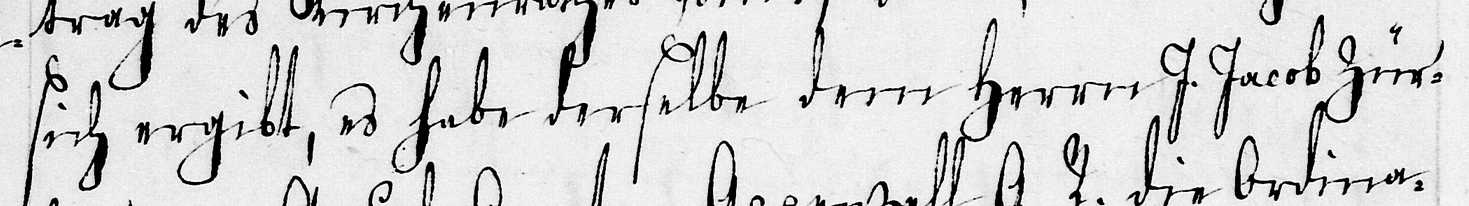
sich ergibt, es habe derselbe dem Herrn J. Jacob Zür¬
